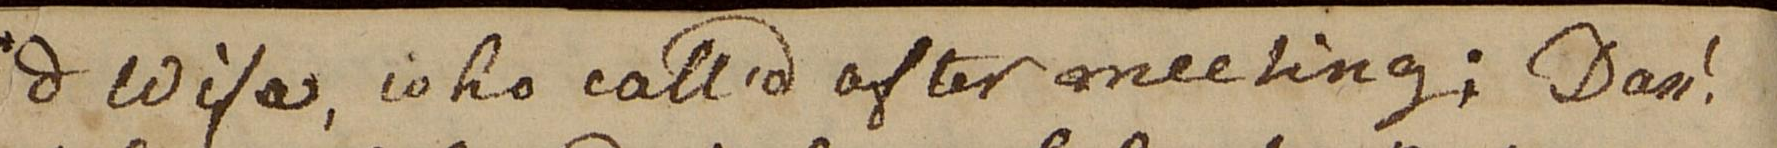d Wife, who call'd after meeting; Dan^l.
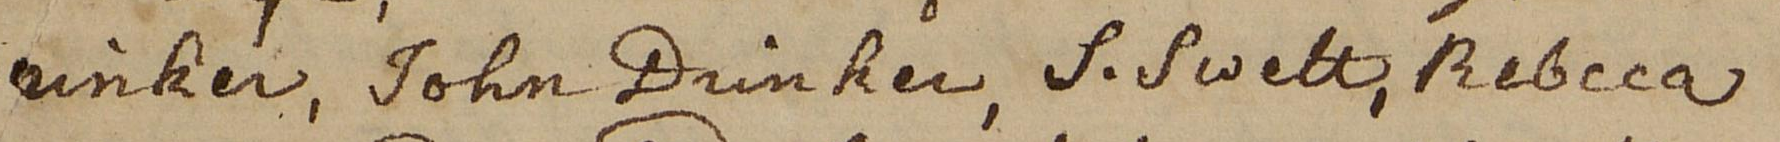rinker, John Drinker, S. Swett, Rebeca
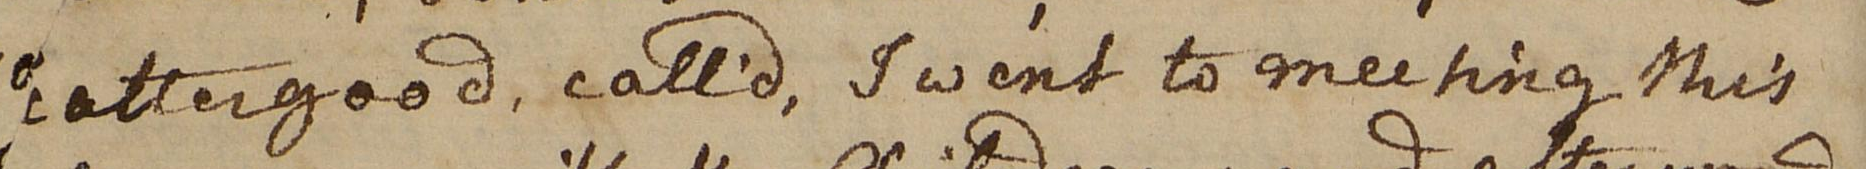attergood, call'd, I went to meeting this
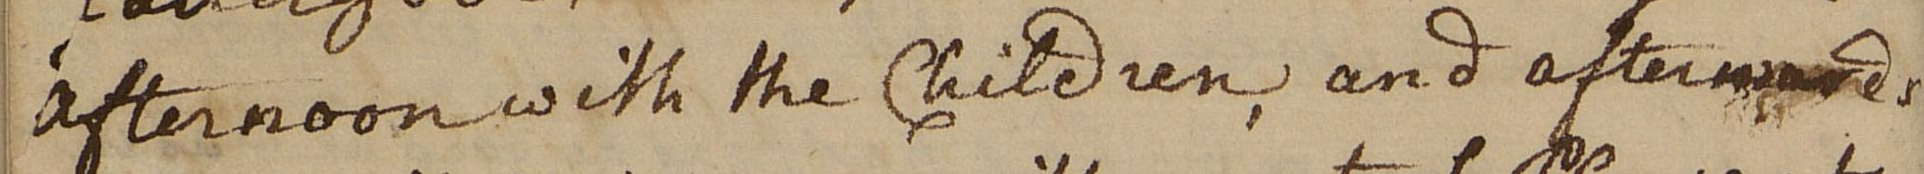Afternoon with the Children, and afterwards
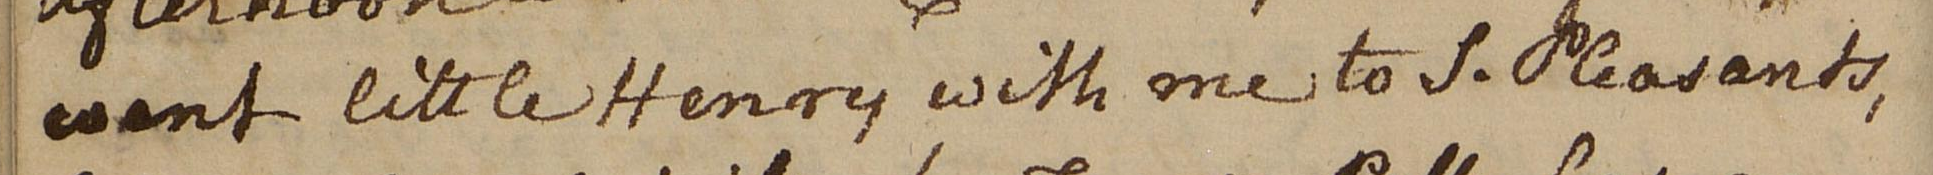want little Henry with me to S. Pleasants,
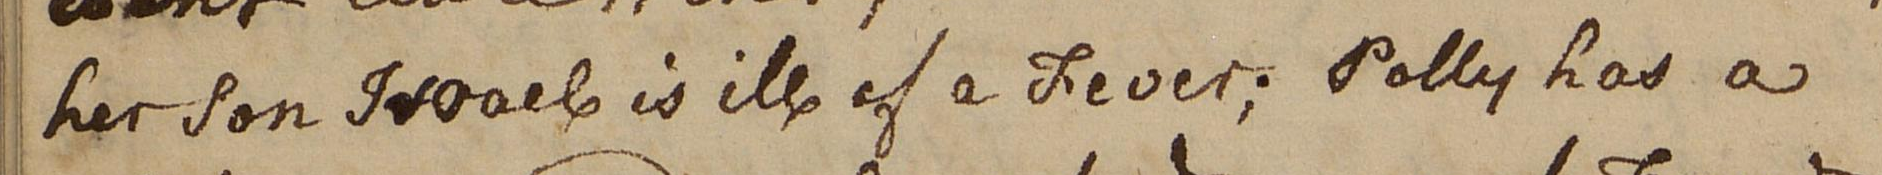her Son Israel is ill of a Fever; Polly has a
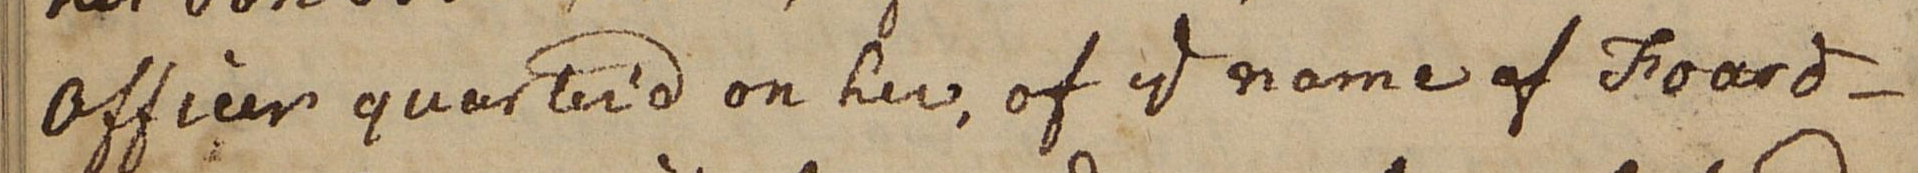Officer quarter'd on her, of y^e name of Foard-
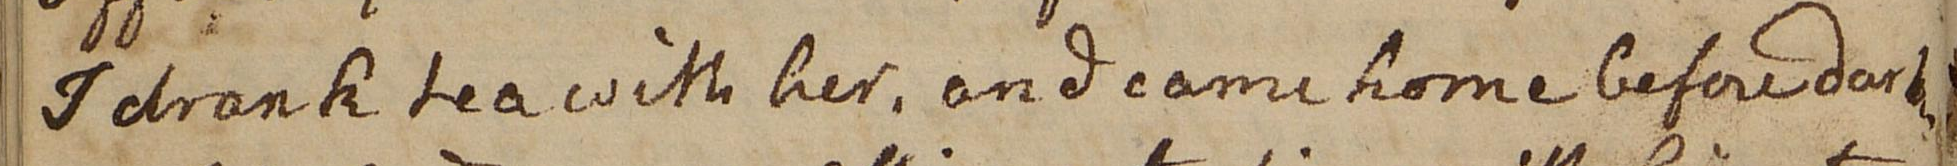I drank tea with her, and came home before dark
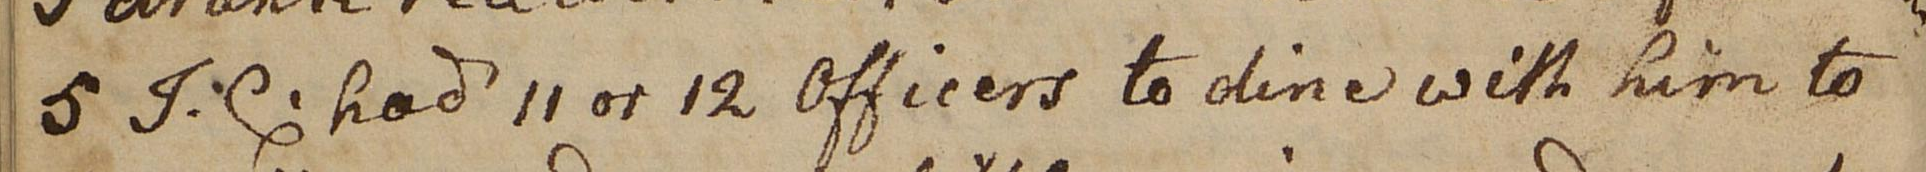5 I. C. had 11 or 12 Officers to dine with him to
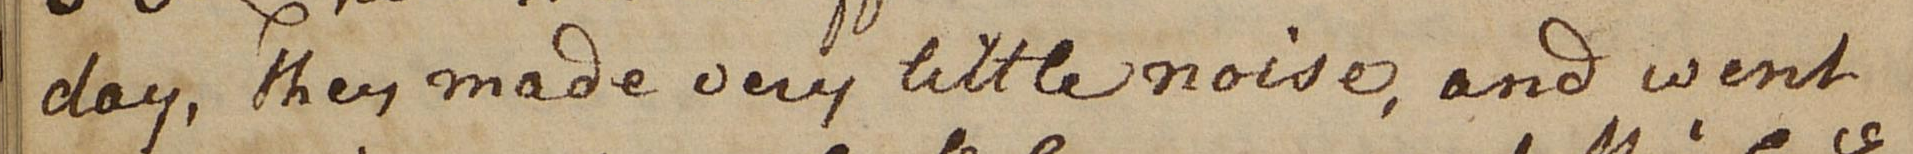day, they made very little noise, and went
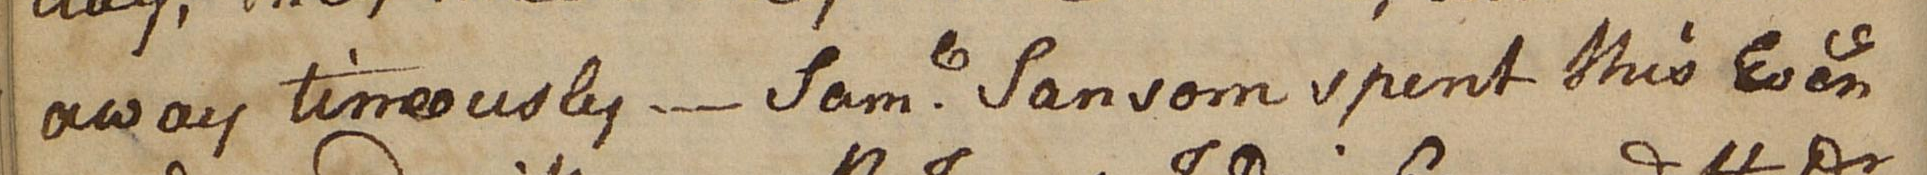away timeously - Sam^l. Sansom spent this Even^g
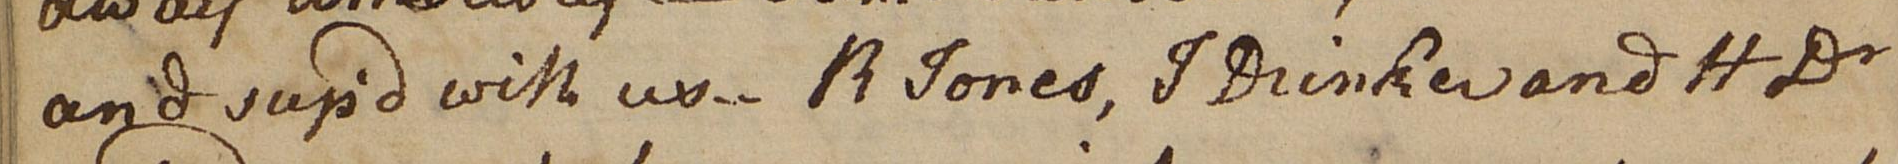and sup'd with us- R Jones, I Drinker and HD
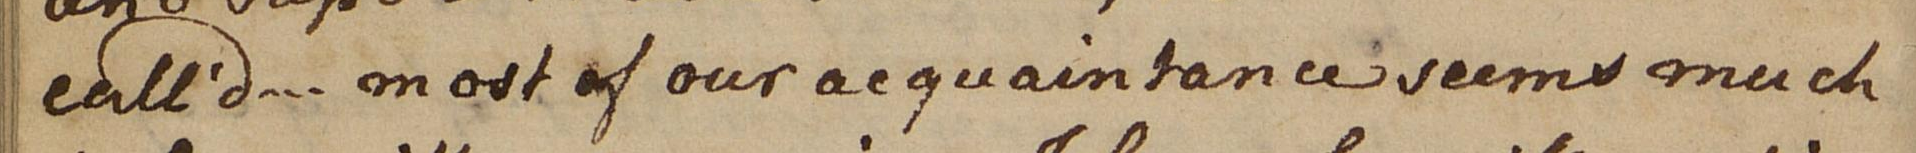call'd - most of our acquaintance seems much
